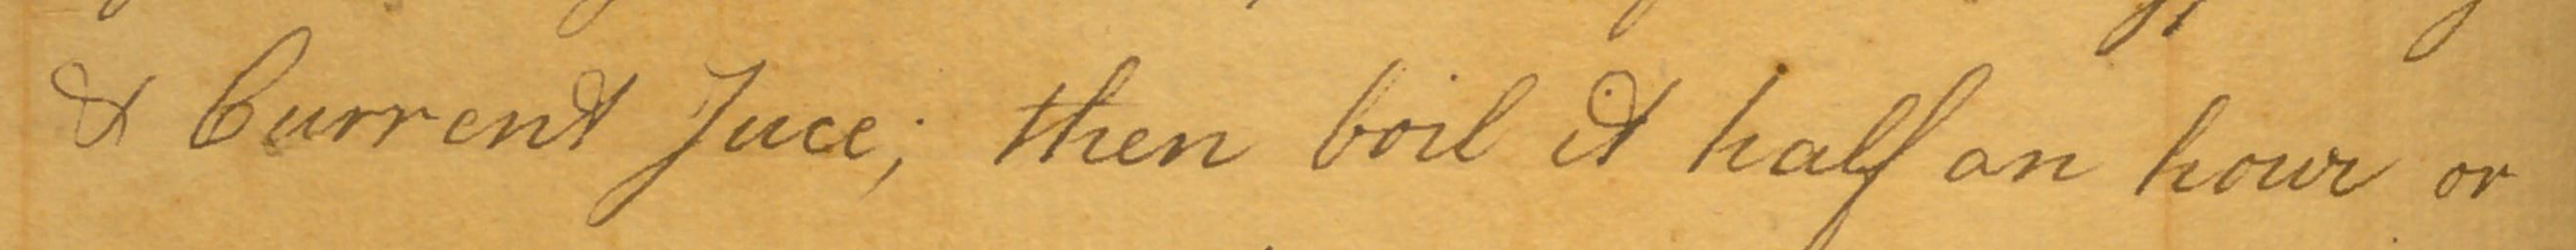& Current Juce; then boil it half an hour or
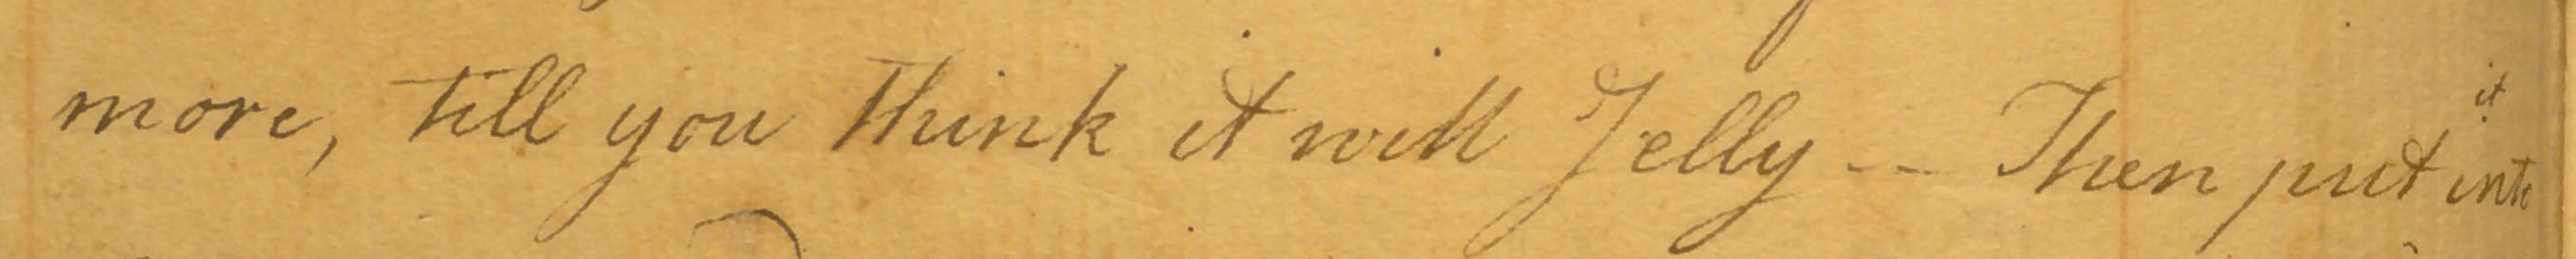more, till you think it will Jelly-- Then put into
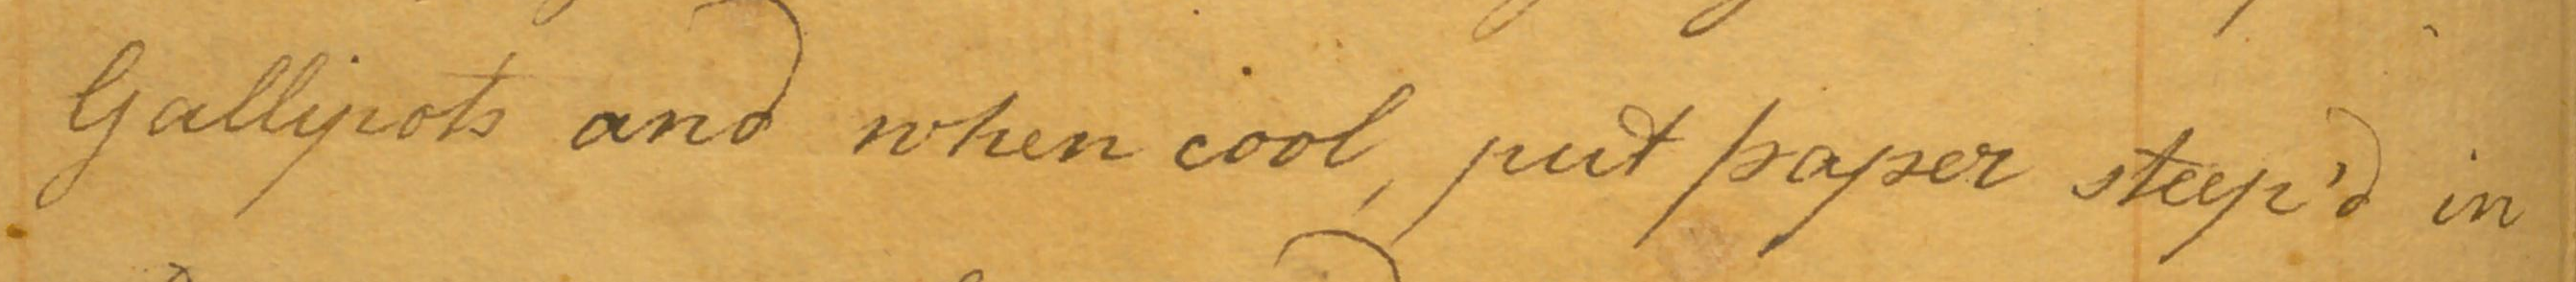Gallipots and when cool, put paper steep'd in
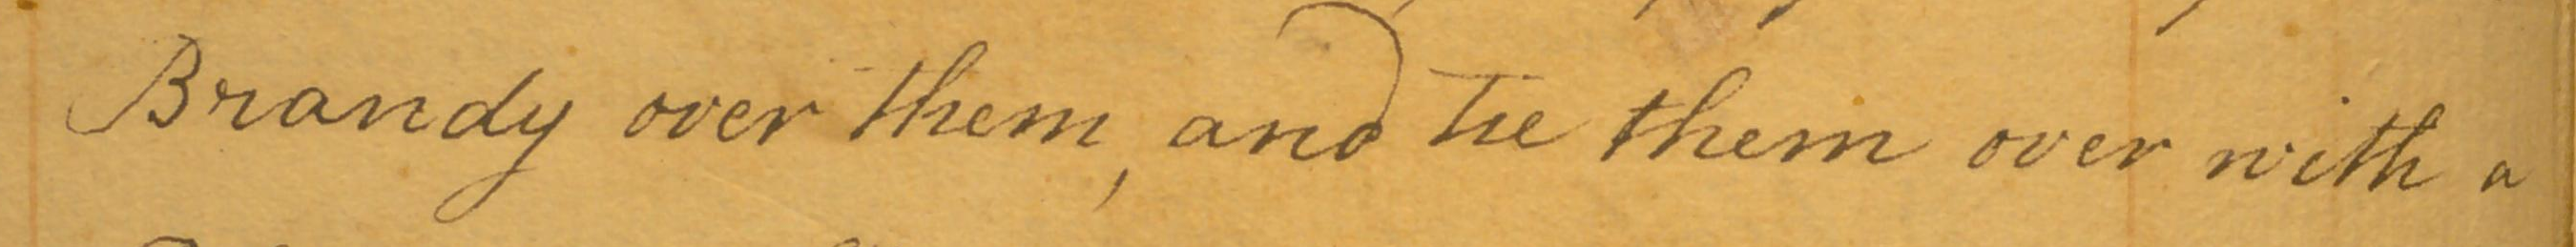Brandy over them, and tie them over with a
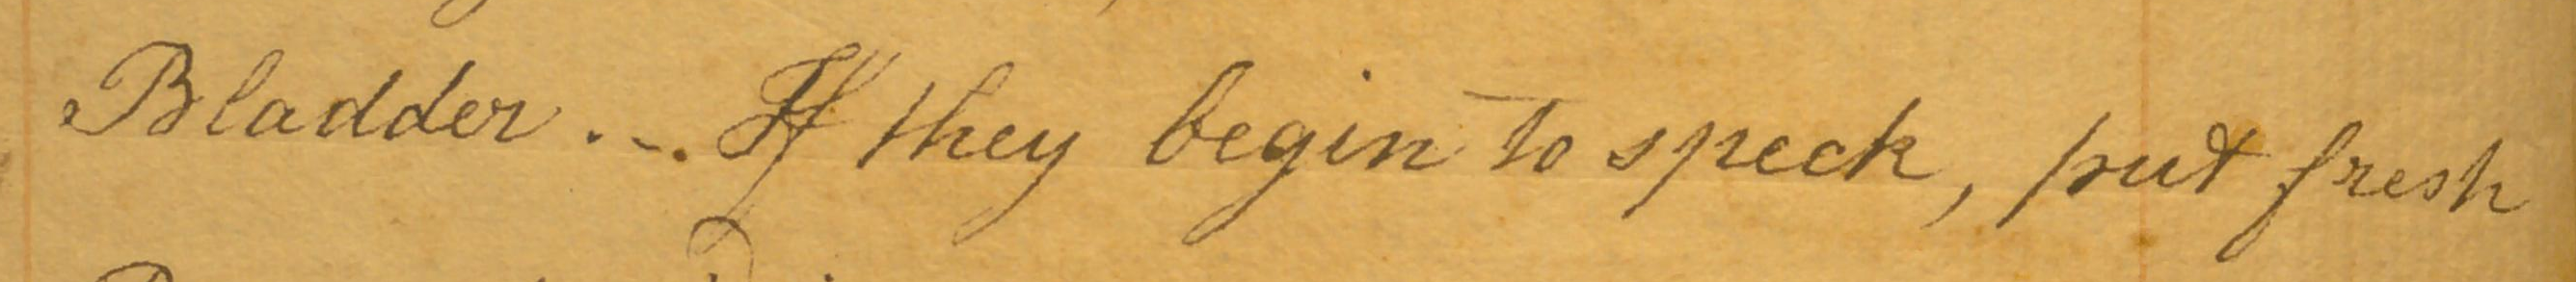Bladder... If they begin to speck, put fresh
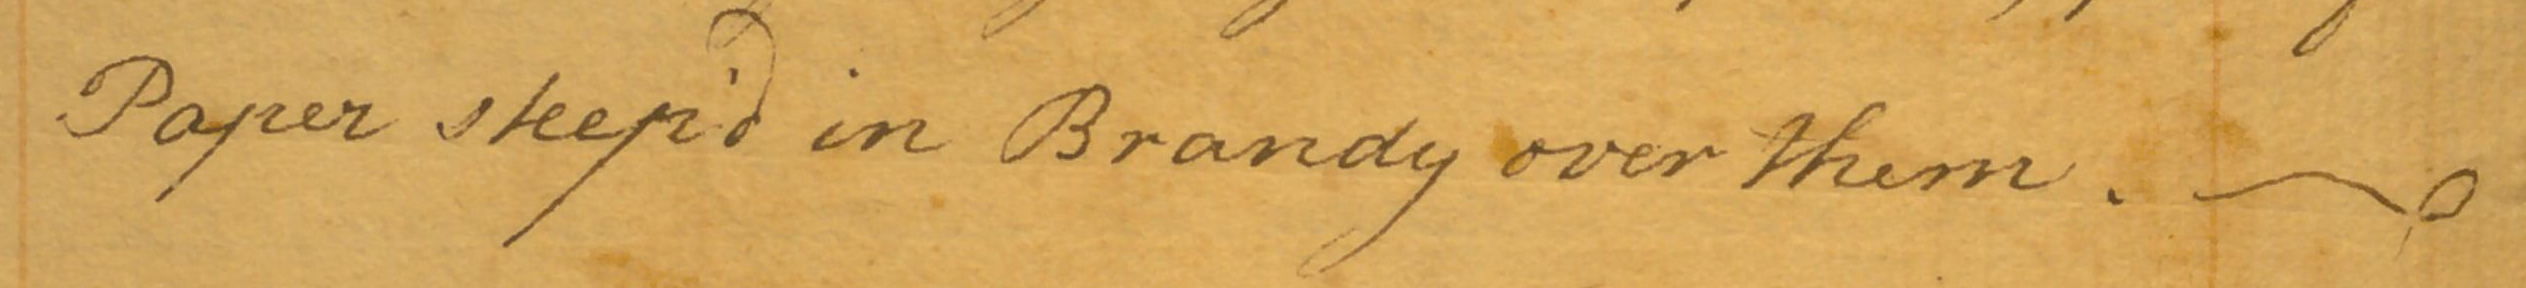Paper steep'd in Brandy over them.-
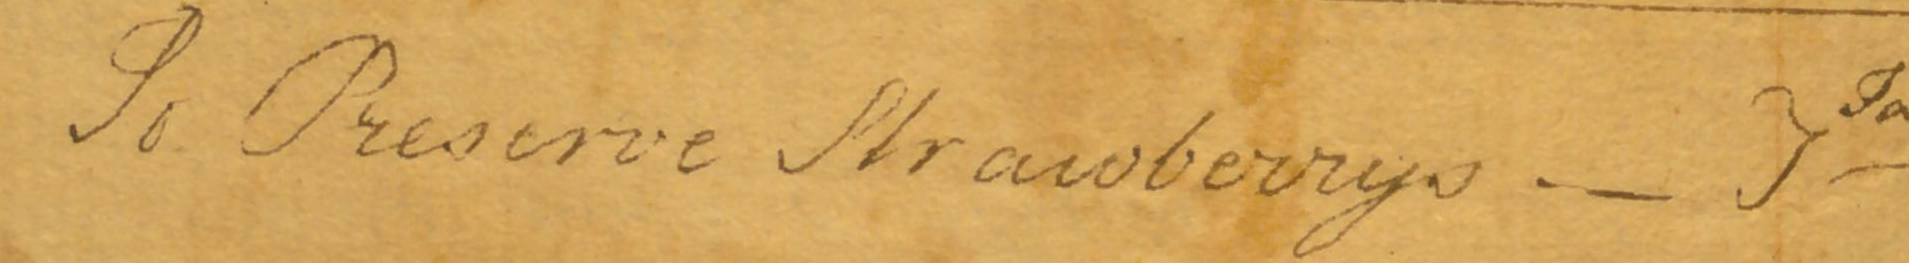To Preserve Strawberrys.-
